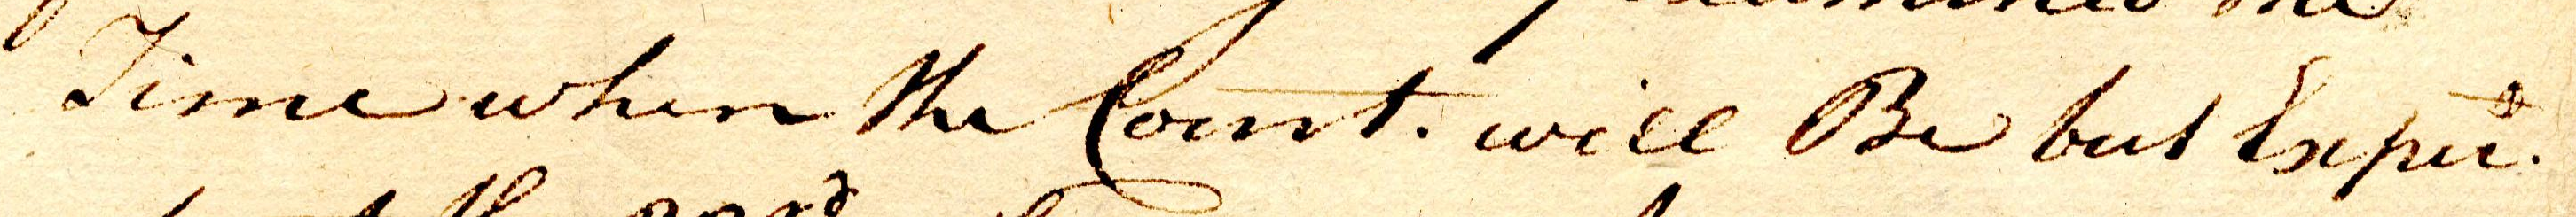Time when the Court will Be but Expect
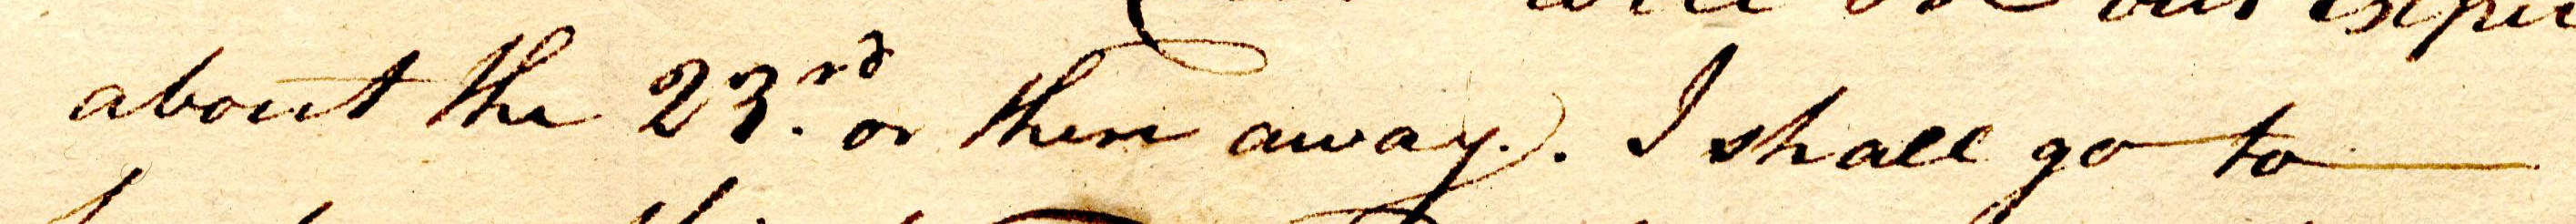about the 23^rd. or there away. I shall go to
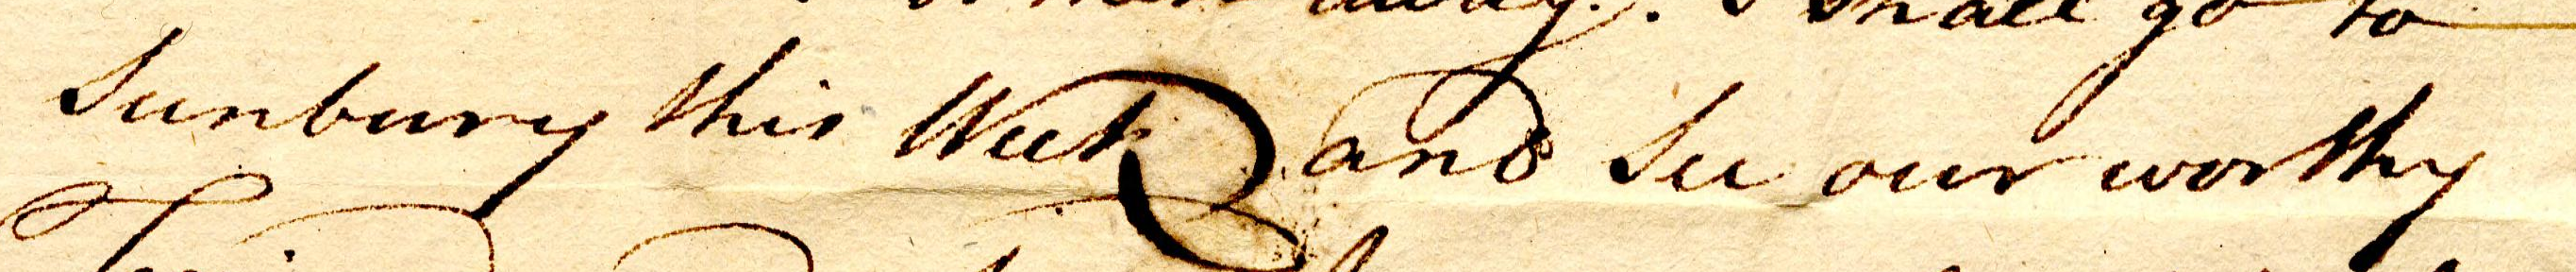Sunbury this Week and see our worthy
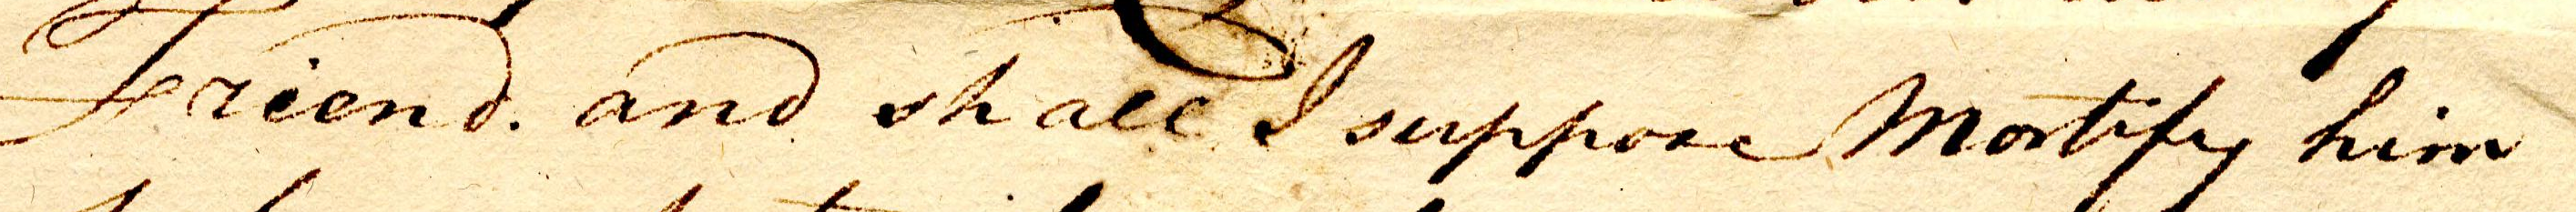Friend and shall I suppose Mortify him
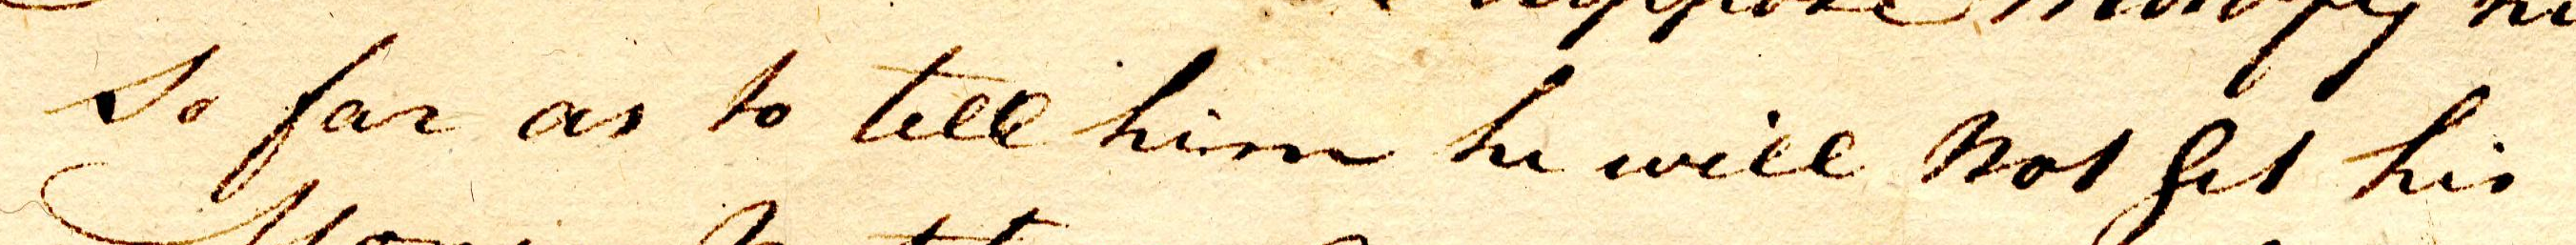so far as to tell him he will Not sit his
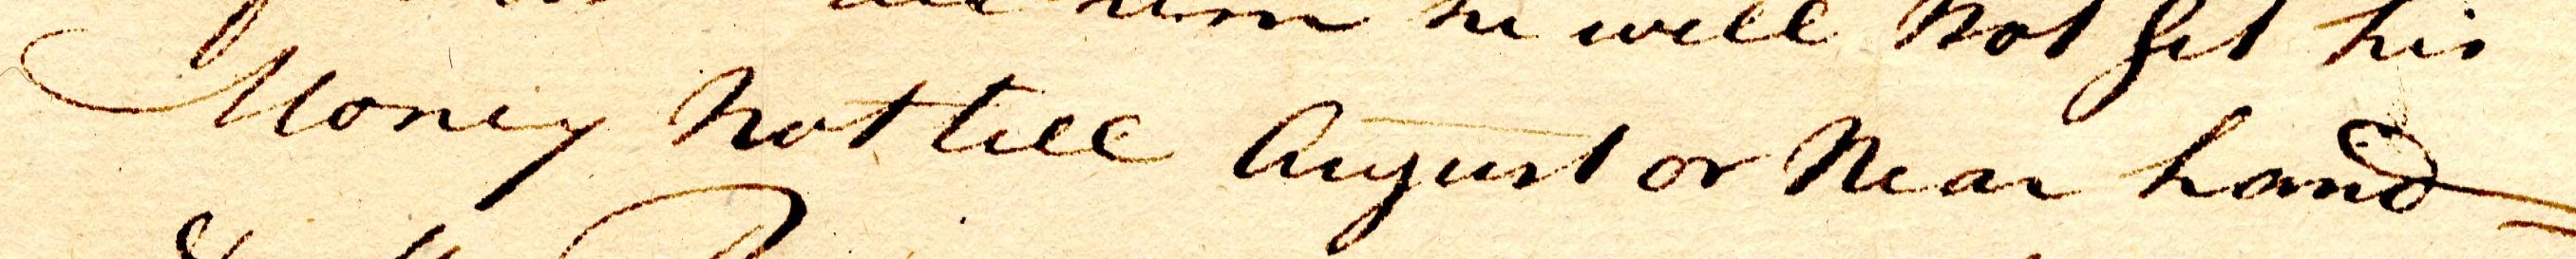Money not till August or Near hand
